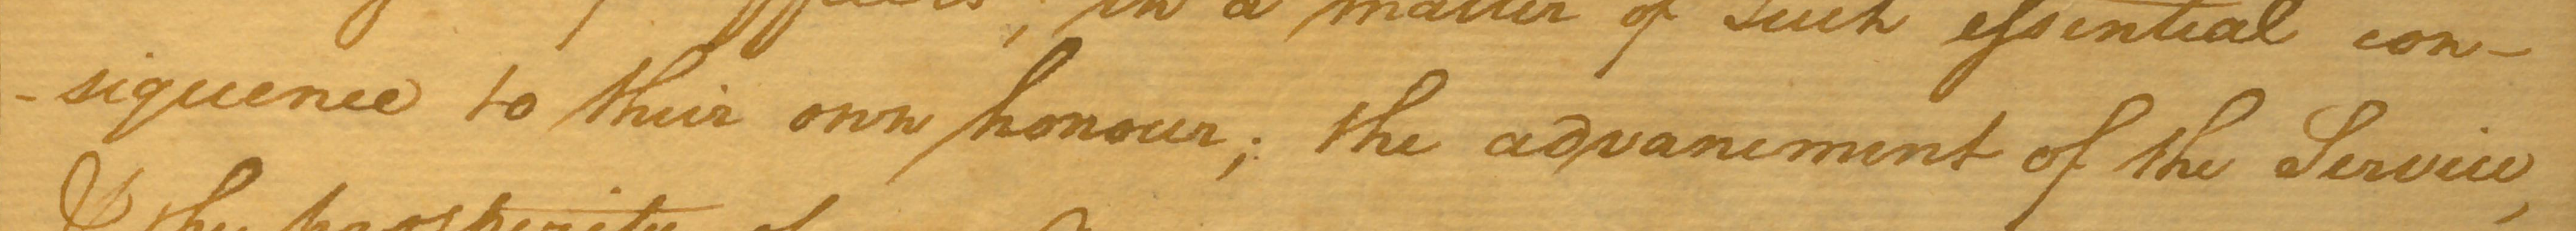-siquence to their own honour; the advancement of the service,
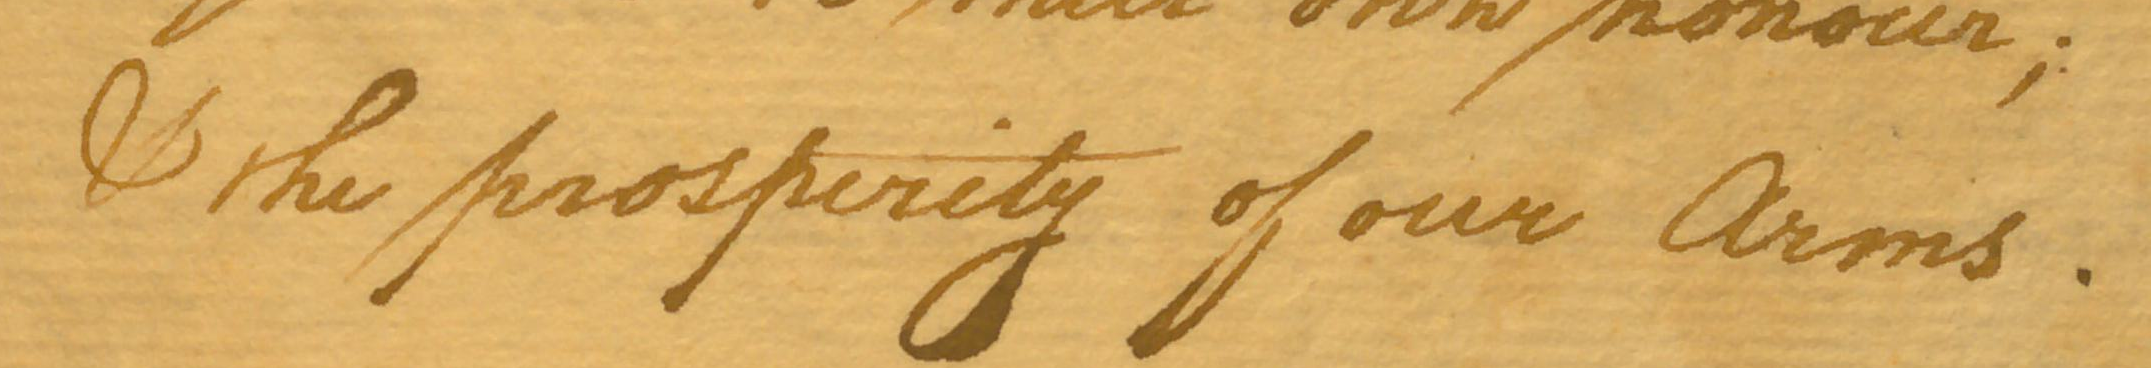& the prosperity of our Arms.
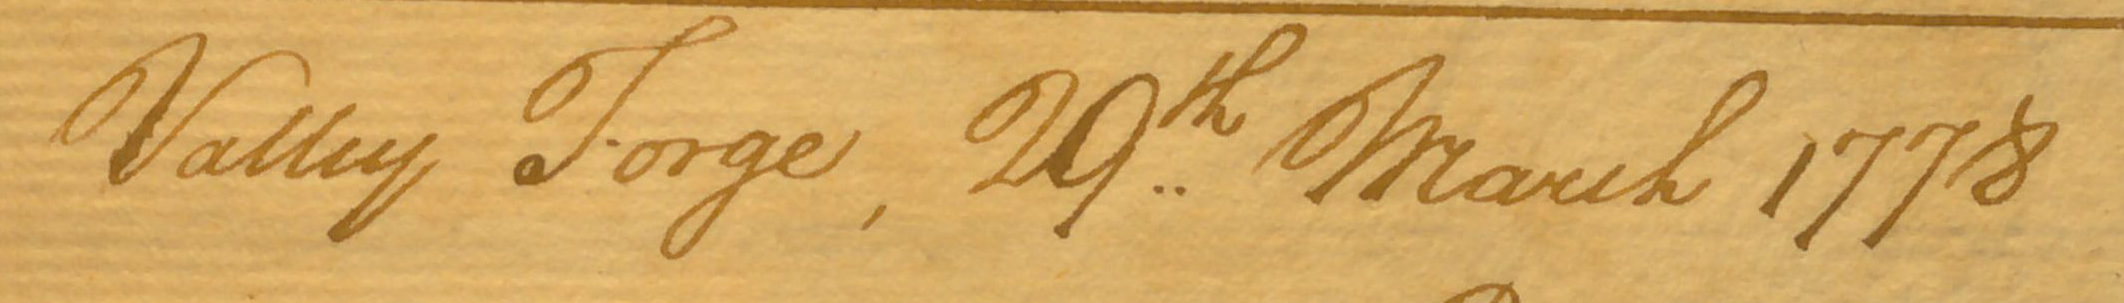Valley Forge, 29^th. March 1778
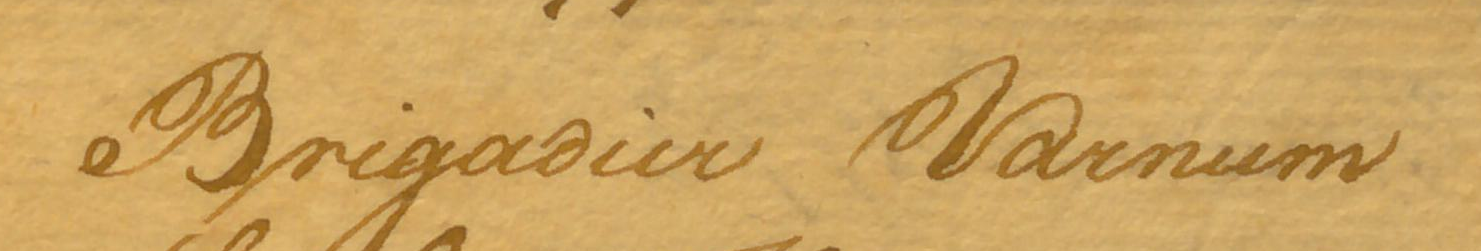Brigadier Varnum
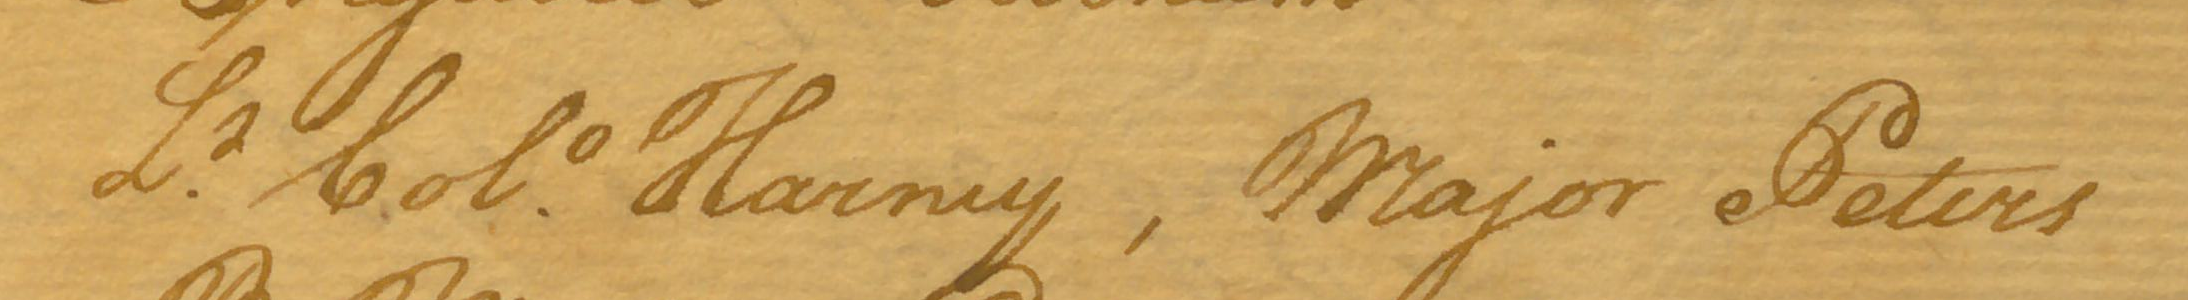L^t. Col^o. Harney, Major Peters
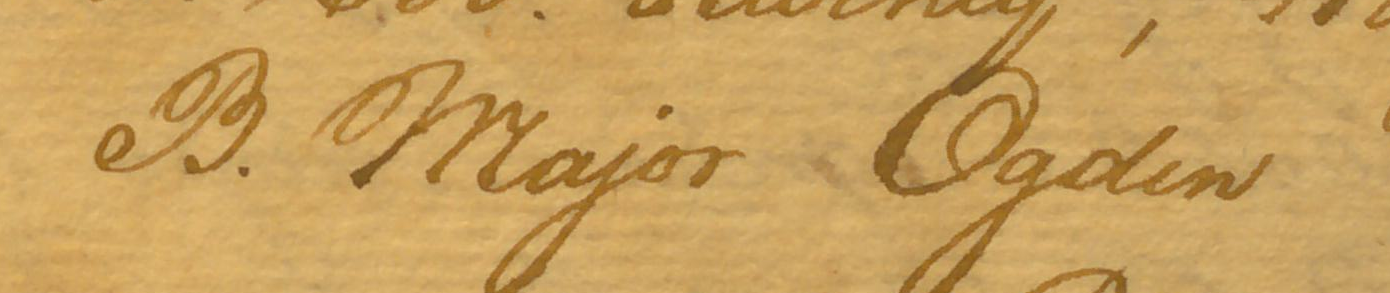B. Major Ogden
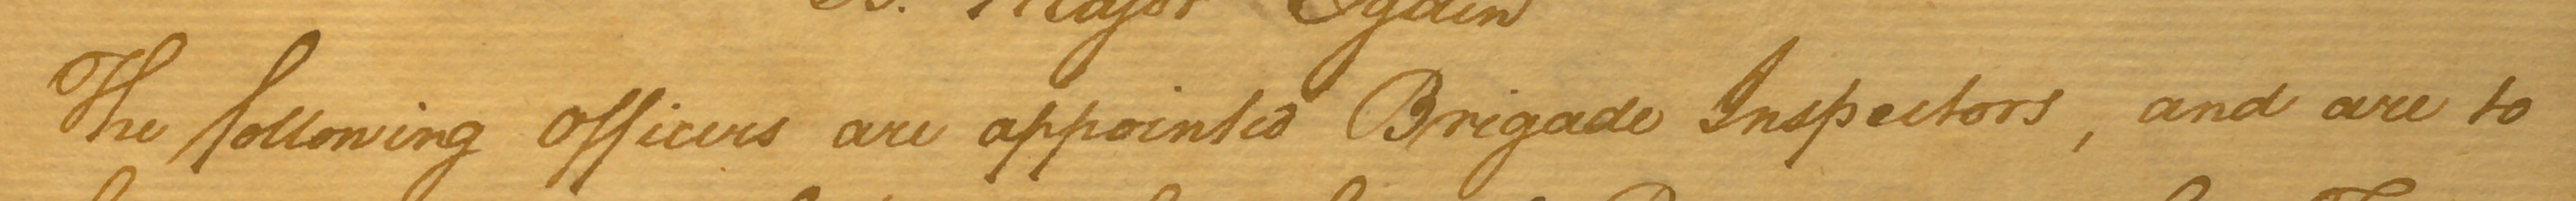The following officers are appointed Brigade Inspectors, and are to
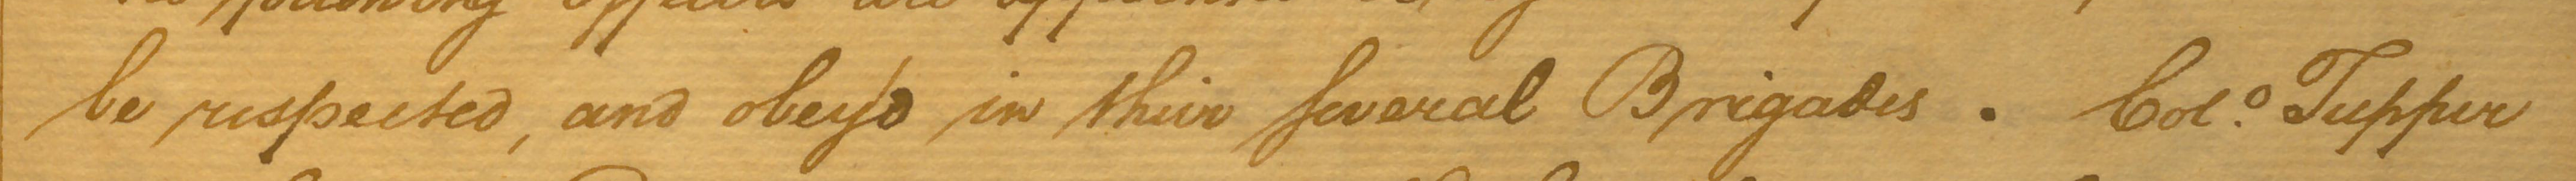be respected, and obey'd in their several Brigades. Col^o. Tupper
